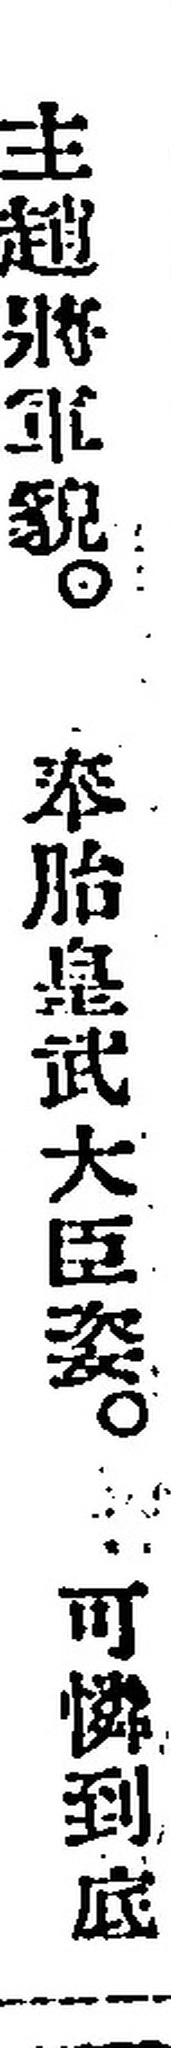主趙将軍貌。奉胎皇武大臣姿。可憐到底
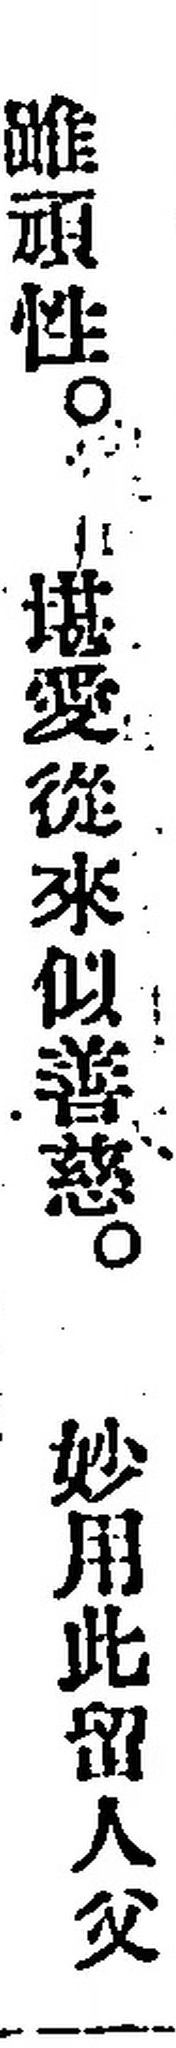雖頑性。堪愛従来似善慈。妙用此留人父
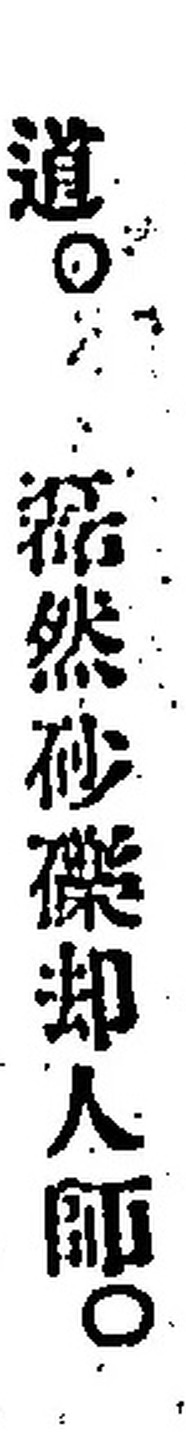道。磊然砂礫却人師。
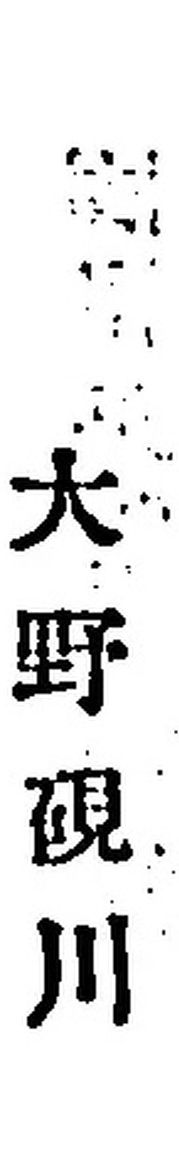大野硯川
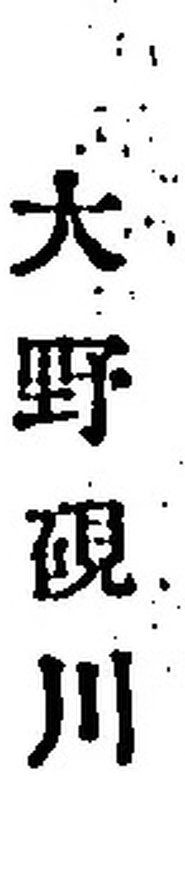大野硯川
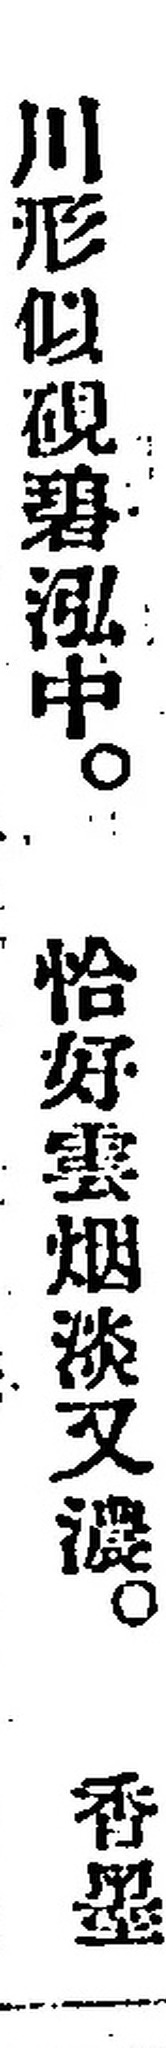川形似硯碧泓中。恰好雲烟淡又濃。香墨
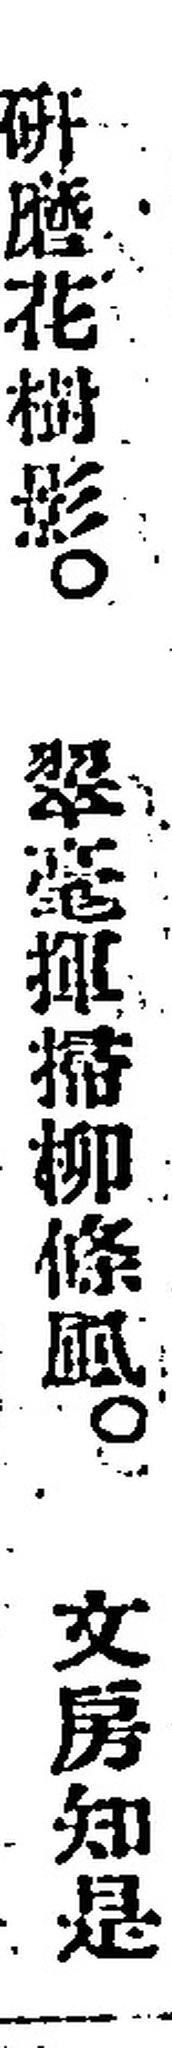研磨花樹影。翠毫揮掃柳条風。文房知是
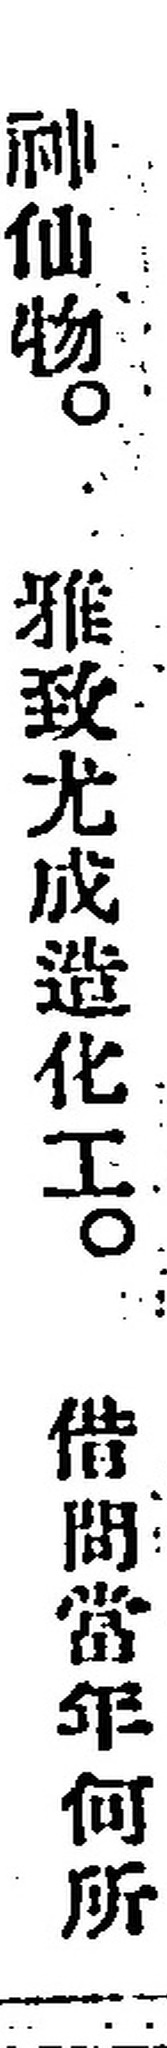神仙物。雅致尤成造化工。借問当年何所
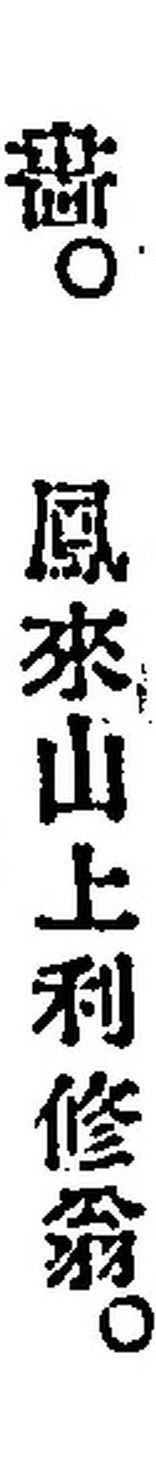画。鳳来山上利修翁。
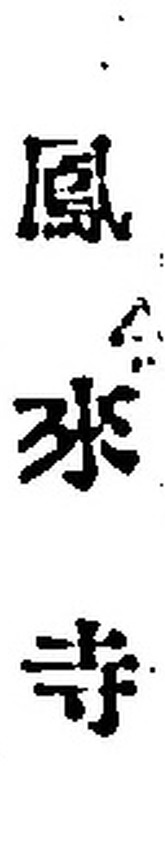鳳来寺
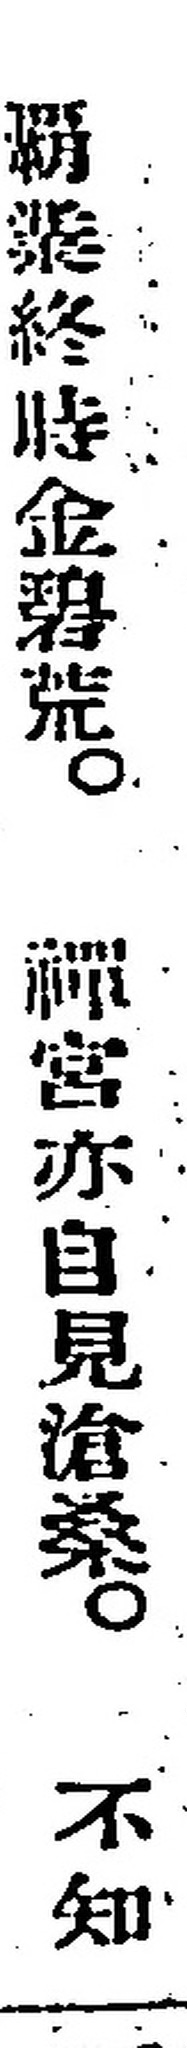覇業終時金碧荒。禅宮亦自見滄桑。不知
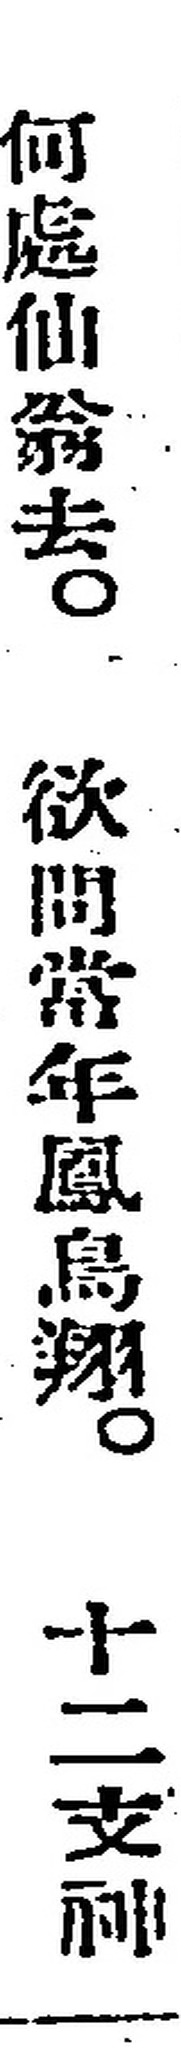何処仙翁去。欲問当年鳳鳥翔。十二支神
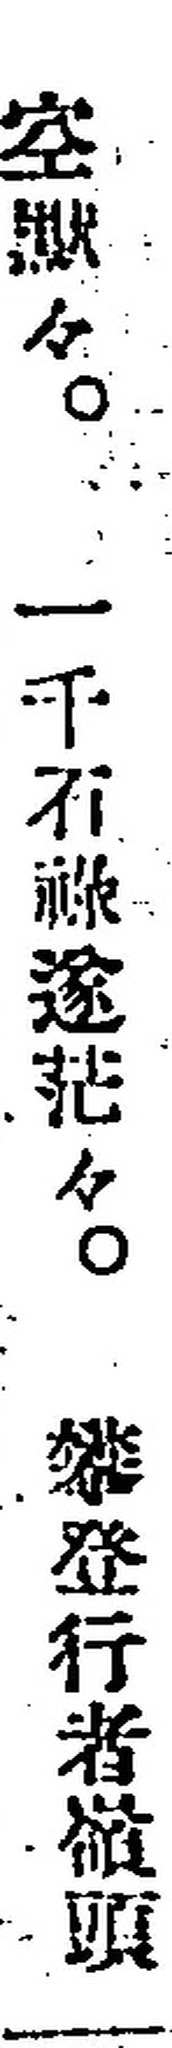空黙々。一千石禄遂茫々。攀登行者嶺頭
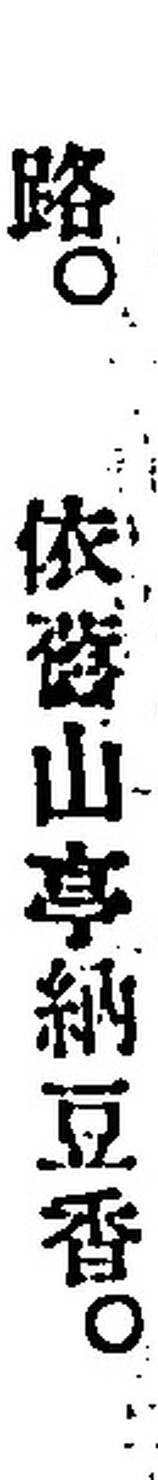路。依旧山亭納豆香。
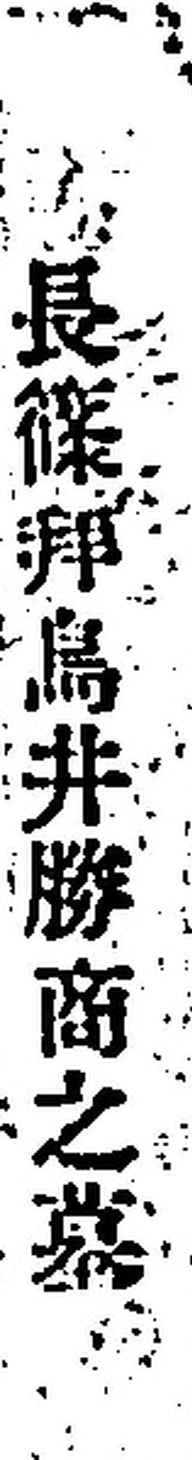長篠拝鳥井勝商之墓
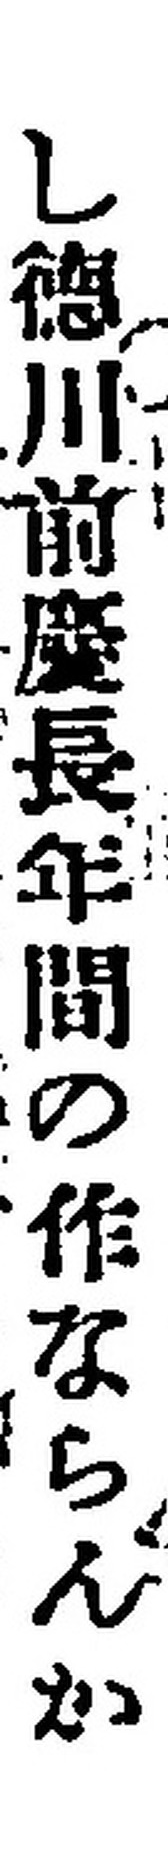し徳川前慶長年間の作ならんか
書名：東参名勝案内
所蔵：国立国会図書館 National Diet Library, JAPAN
